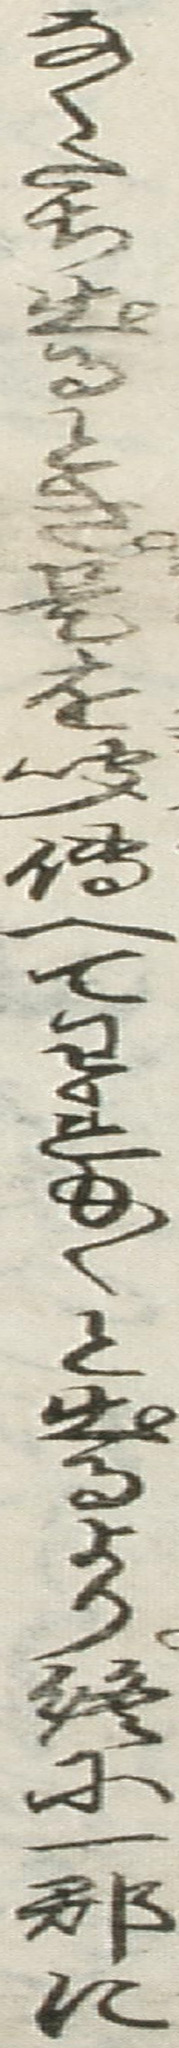なくたち出るとき。是を聞傳へてわれも〳〵と出るより。終に一郡に
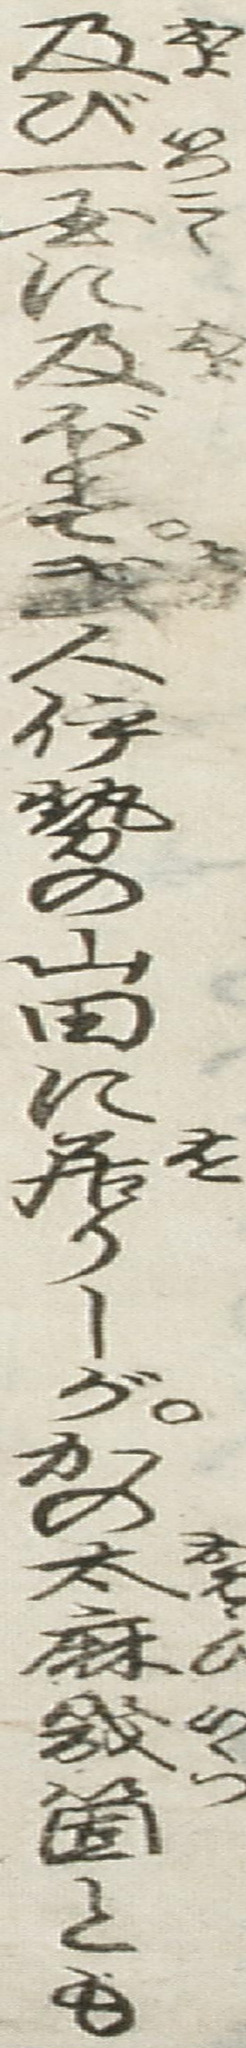及び一国に及ぼす。或人伊勢の山田に居りしが。かの太麻幾箇とも
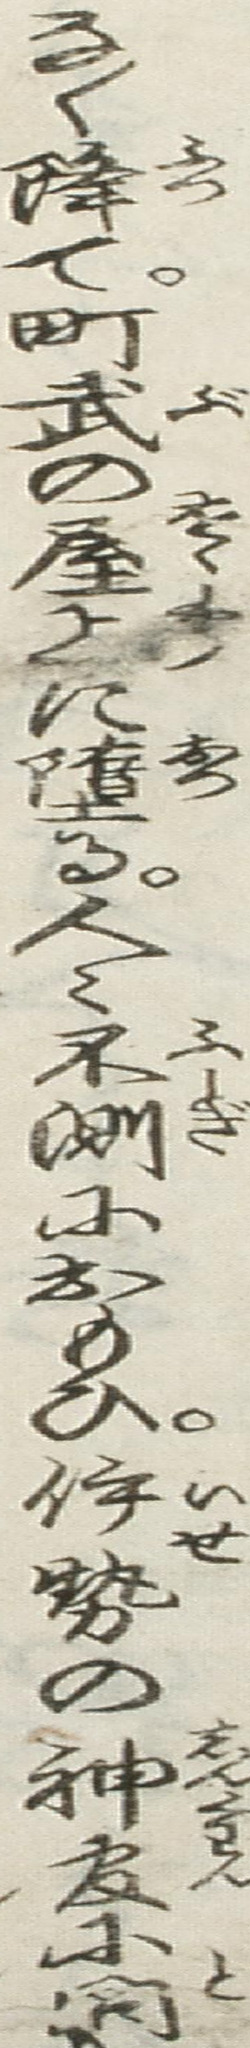なく降て。町武の屋上に堕る。人々不測におもひ。伊勢の神官に問
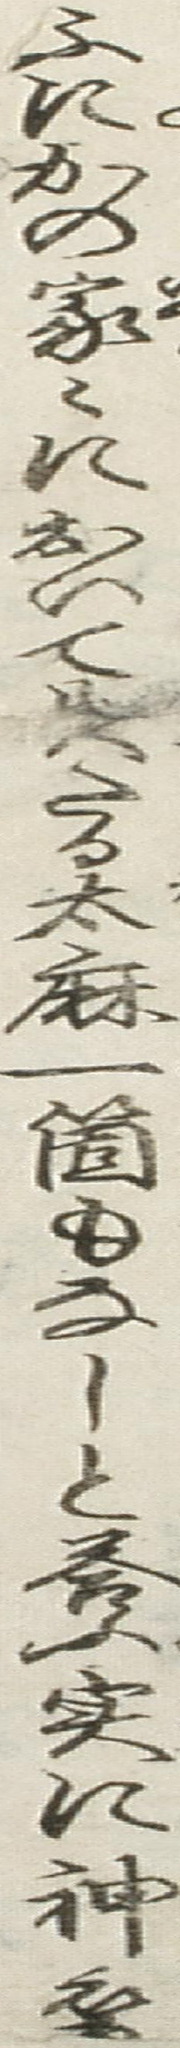ふに。かの家々において失たる太麻。一箇もなしと答ふ。実に神変
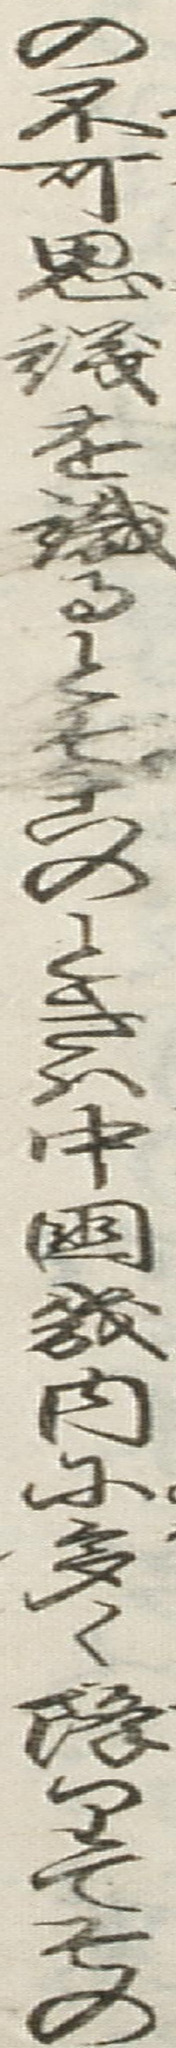の不可思議を識るとそ。このときは中国畿内に。多く降りてその
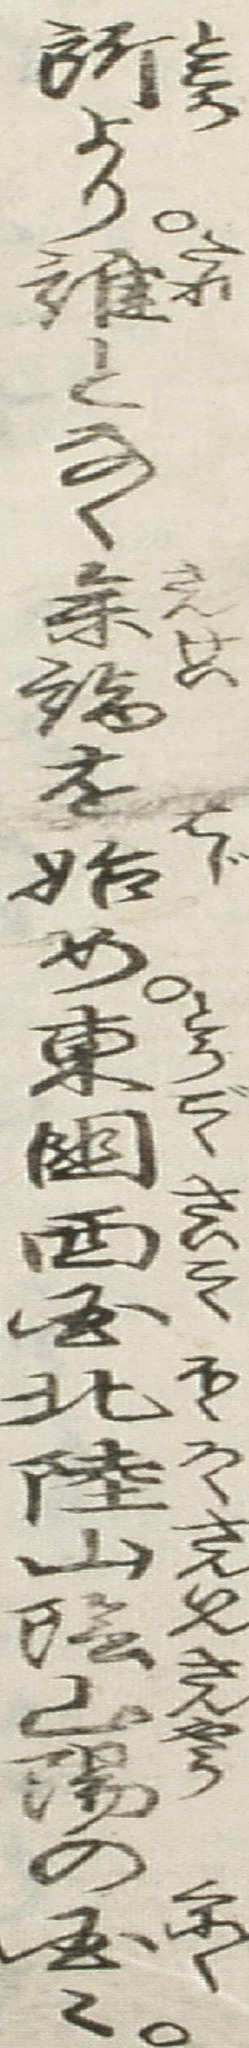所より。誰となく参詣を始め。東国西国北陸山陰山陽の国々。
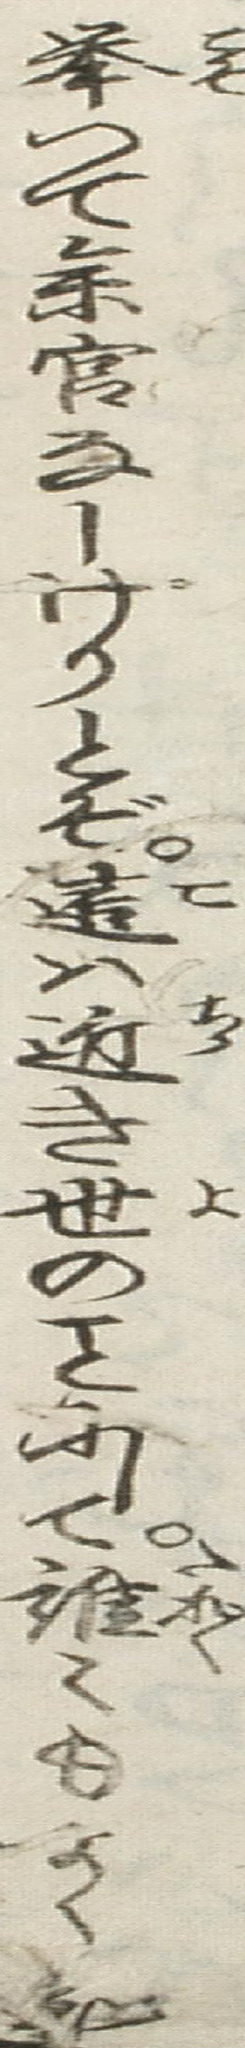挙つて参宮なしけりとぞ。這は近き世のことにして。誰々もなく知
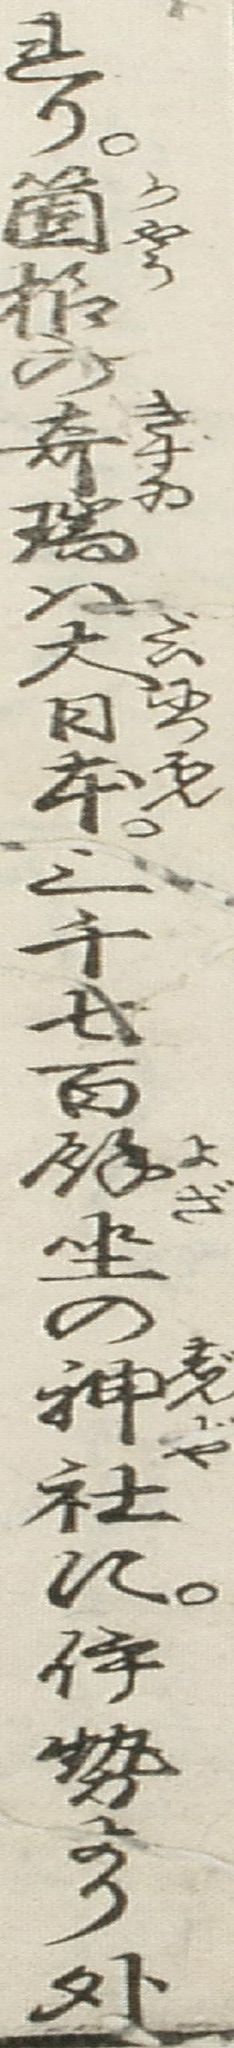れり。箇様の奇瑞は大日本。三千七百餘坐の神社に。伊勢より外
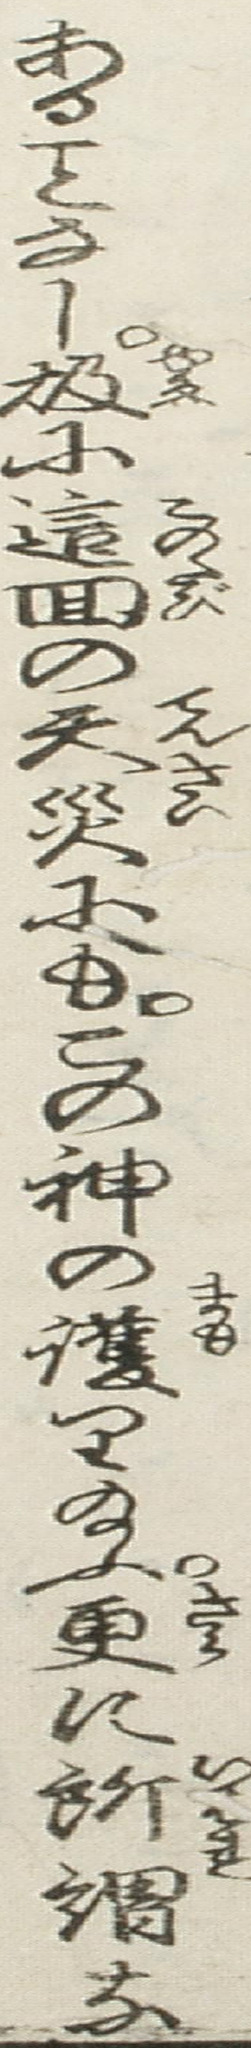あることなし。故に這回の天災にも。この神の護り給ふ。更に所謂な
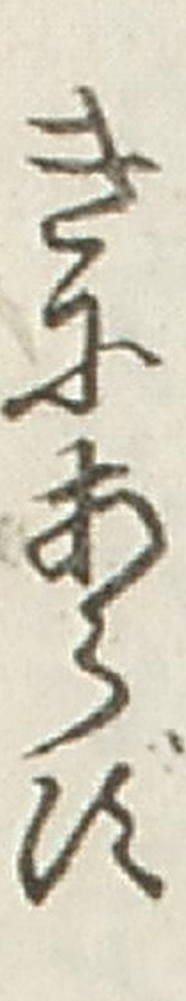きにあらず
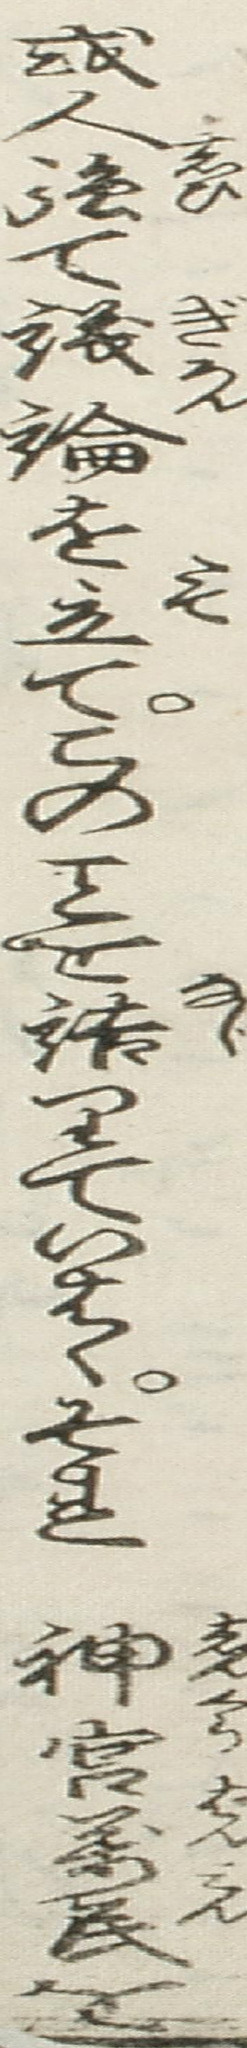ある人強て議論を立て。このことを詰りていはく。それ神宮万民を
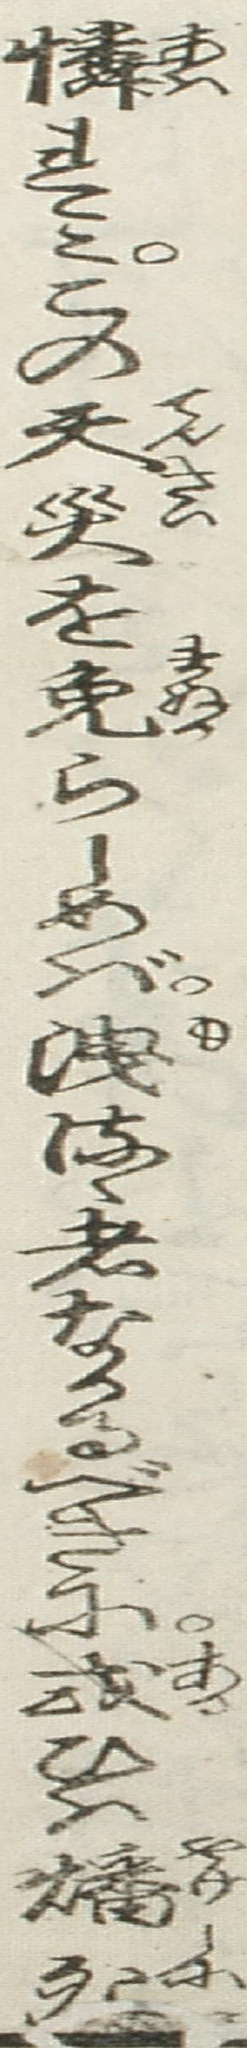憐れみ。この天災を免らしめば。洩るゝ者なかるべきに。或ひは燔死
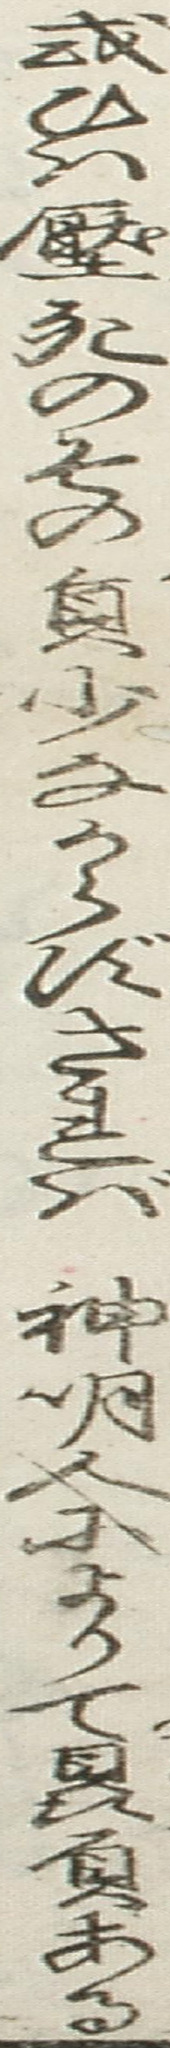或ひは壓死のその員少なからず。されば神明人によりて。贔屓ある
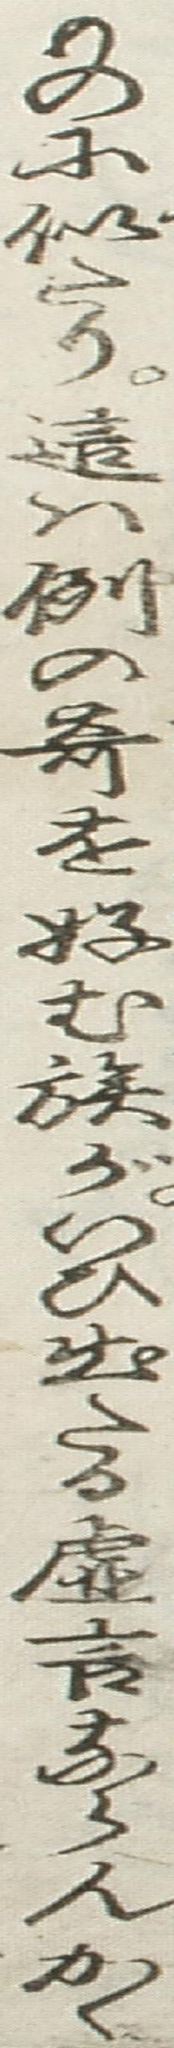ものに似たり。這は例の奇を好む族が。いひ出たる虚言ならん。かく
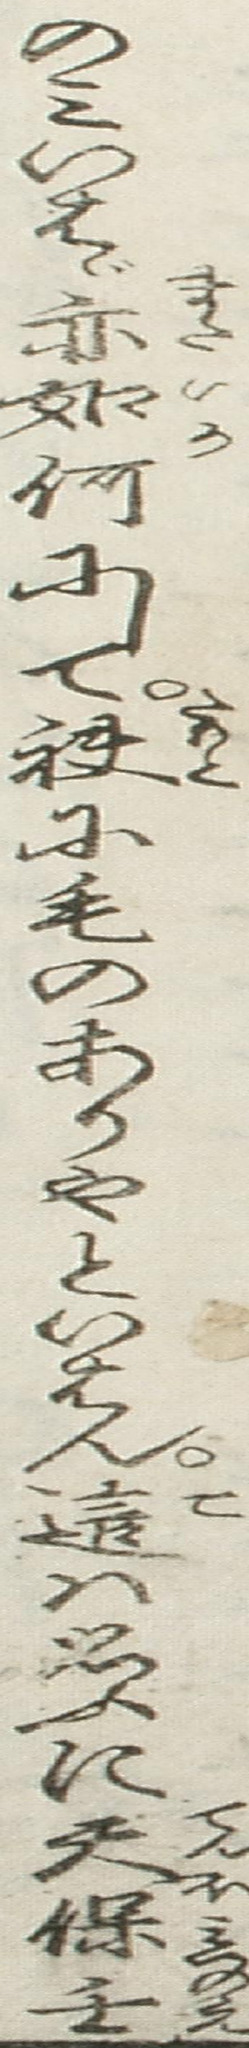のみいはゞ。亦如何にして。袂に毛のありやといはん。這は思ふに天保壬
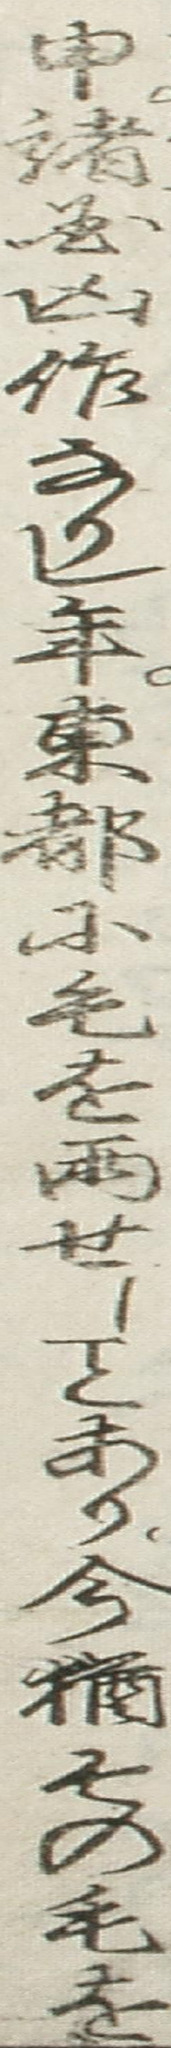申。諸国凶なりし年。東都に毛を雨せしことあり。今猶その毛を
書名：安政見聞録　下
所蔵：東京大学地震研究所図書室 Earthquake Research Institute Library, The University of Tokyo, JAPAN
